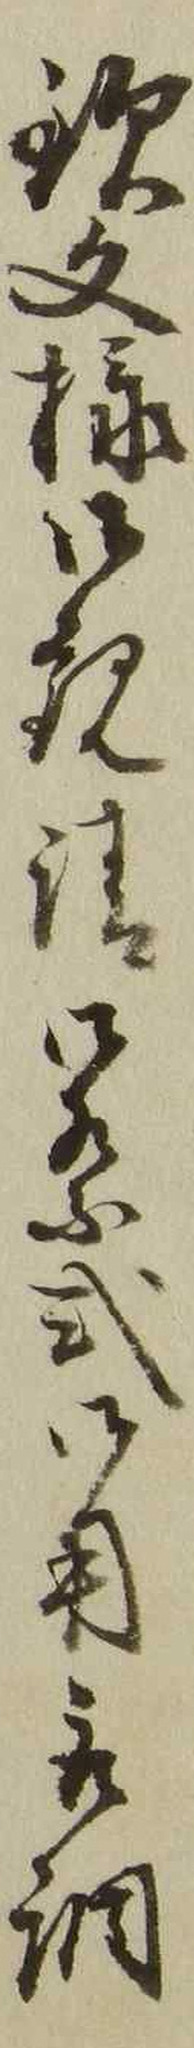欽文様御観請御祭式御用取調
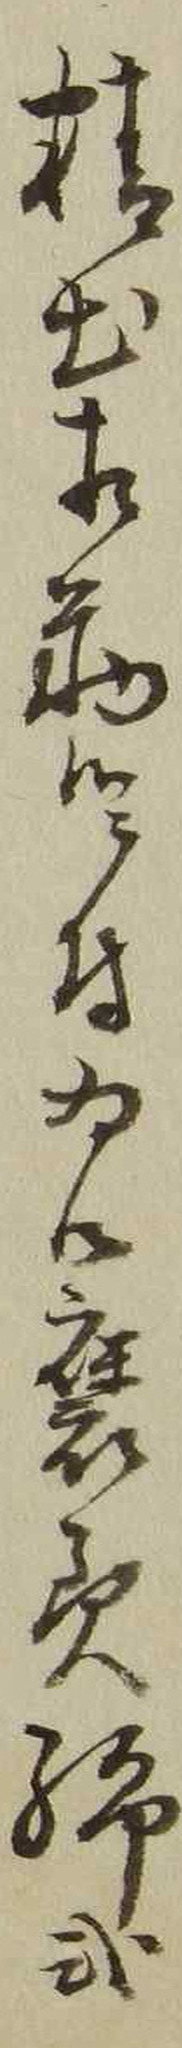精出相勤候ニ付為御褒美綿弐
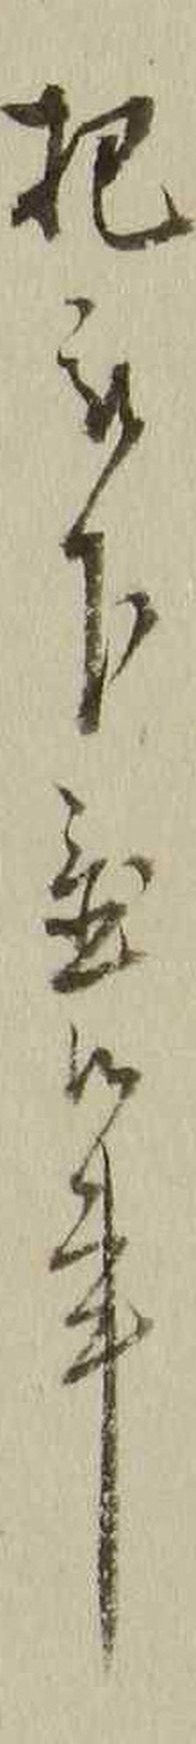把被下置候事
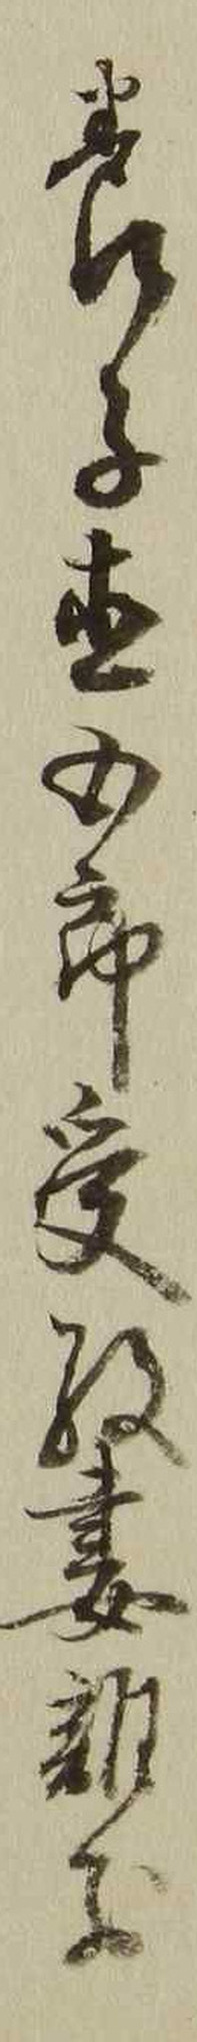女養子直五郎受敬妻離別
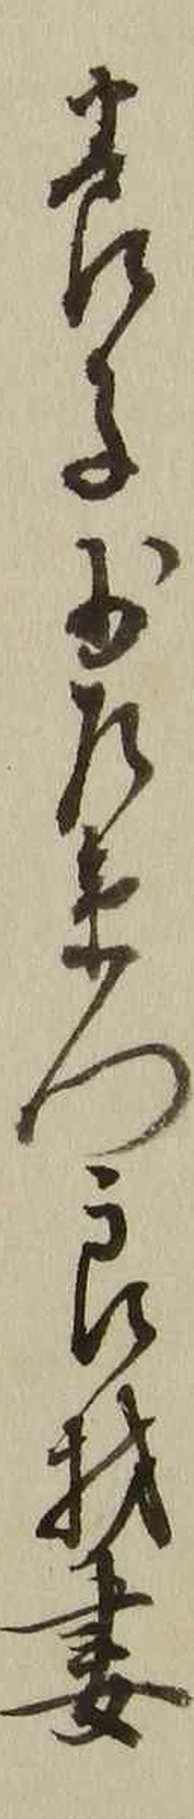養子少左衛門良材妻
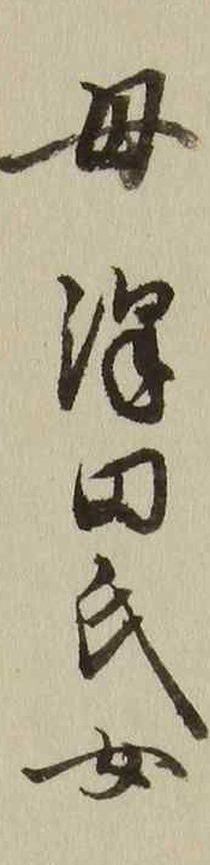母沢田氏女
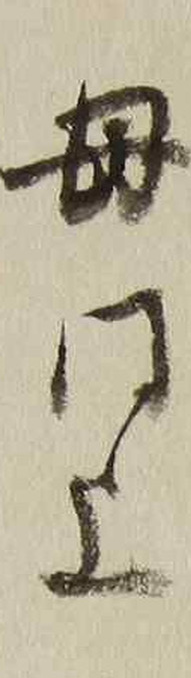母同上

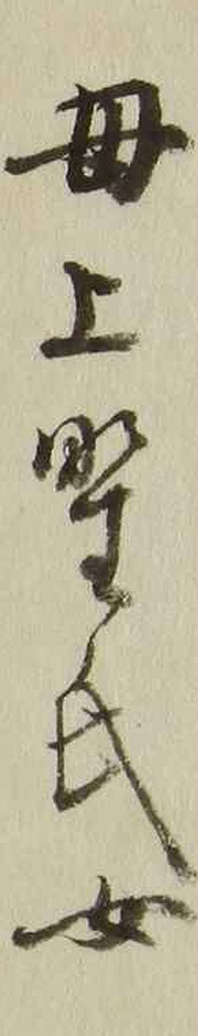母上野氏女
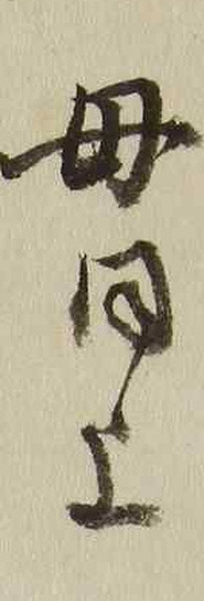母同上
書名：諸士系譜　巻之39　は之部7
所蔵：会津若松市立会津図書館
